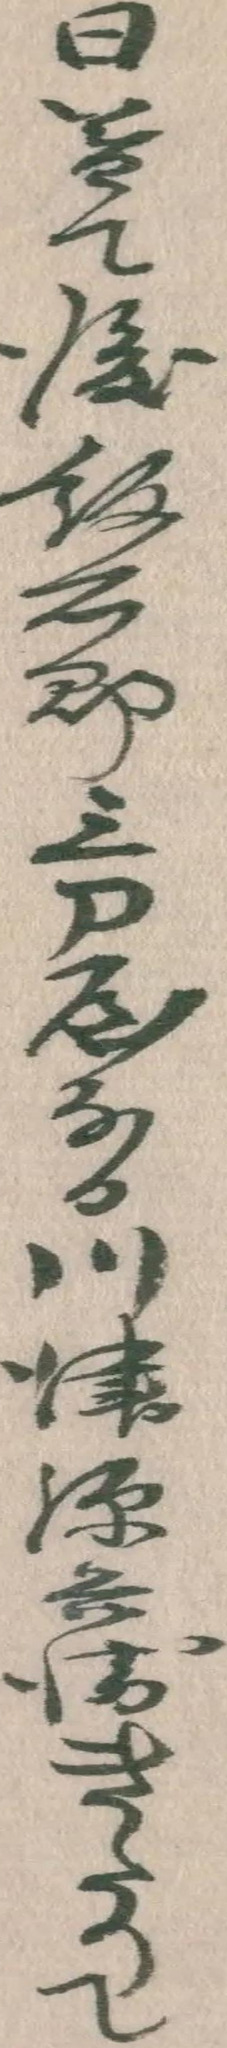日暮て後飯石郡三刀屋なる川津源兵衛きたりて
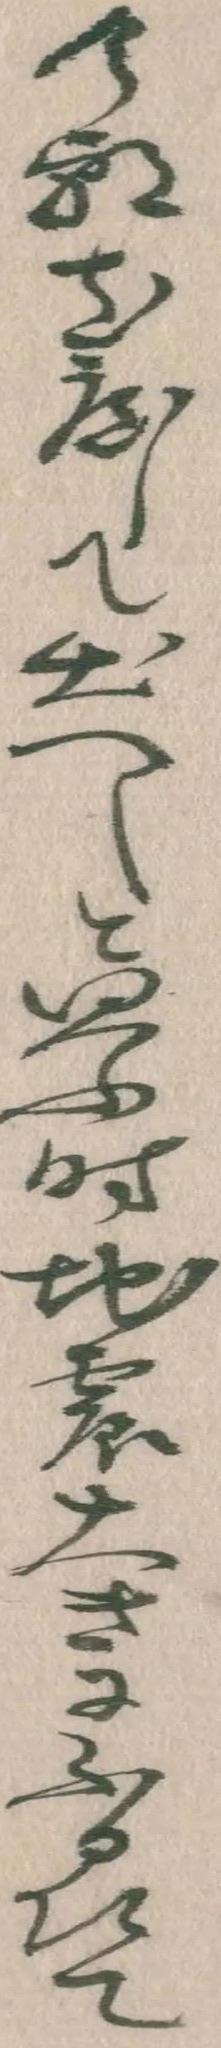今朝支度して出へしと思ふ時地震大きにふるひて
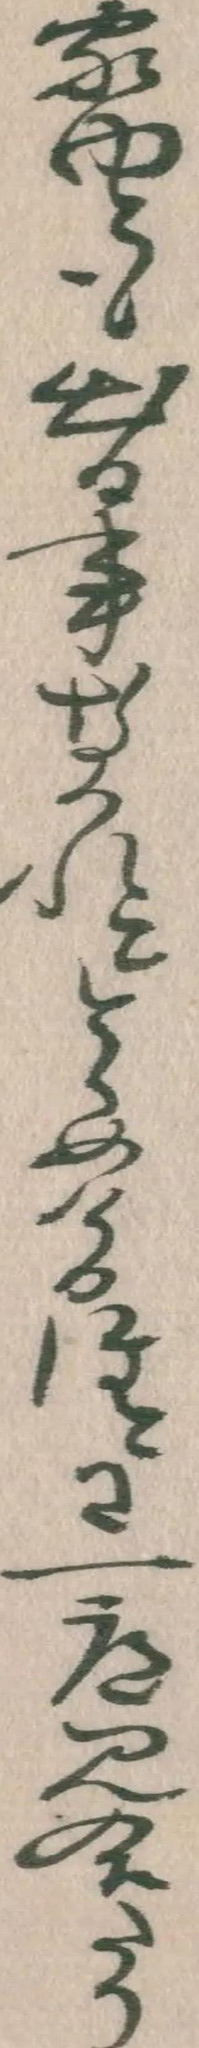家内とも出る事なかれととゝめけるほとに一度見合たり
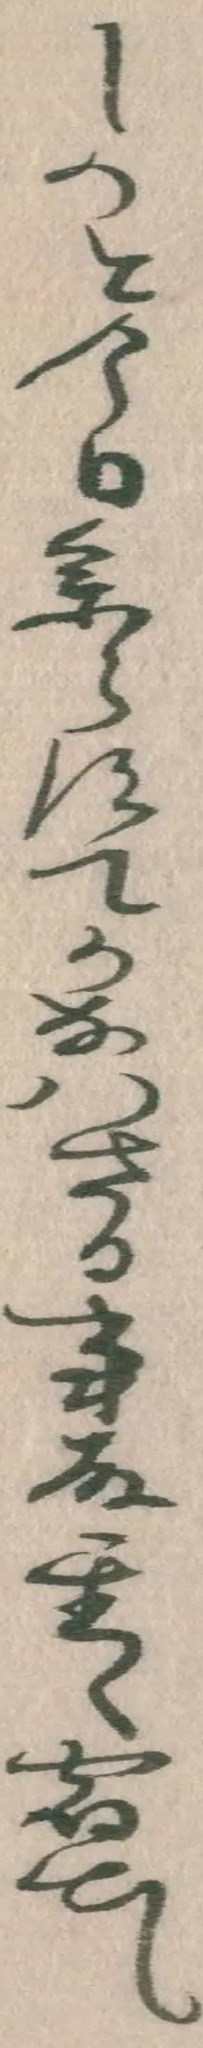しかと今日参らすてかなはさる事故遅く宿出候
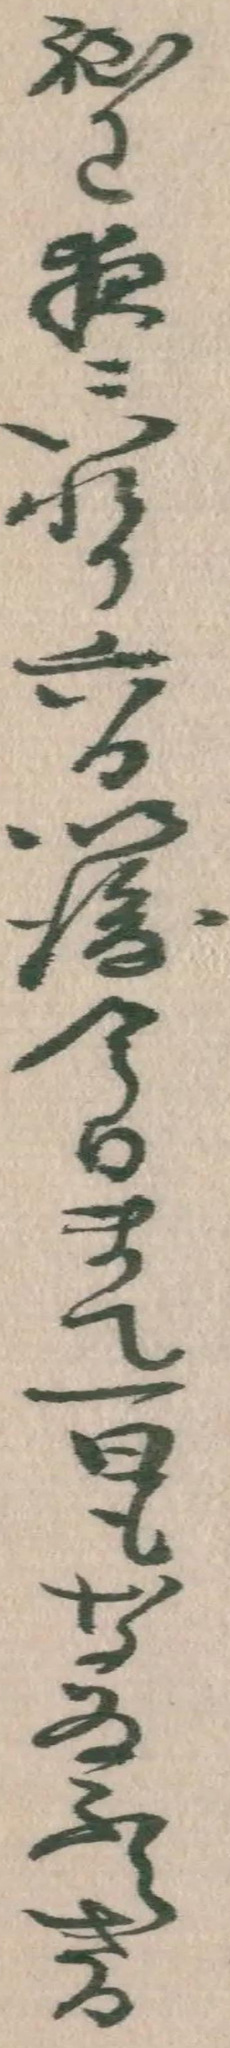程に夜にいれり六日以後今日まて一日もなゐふらさる
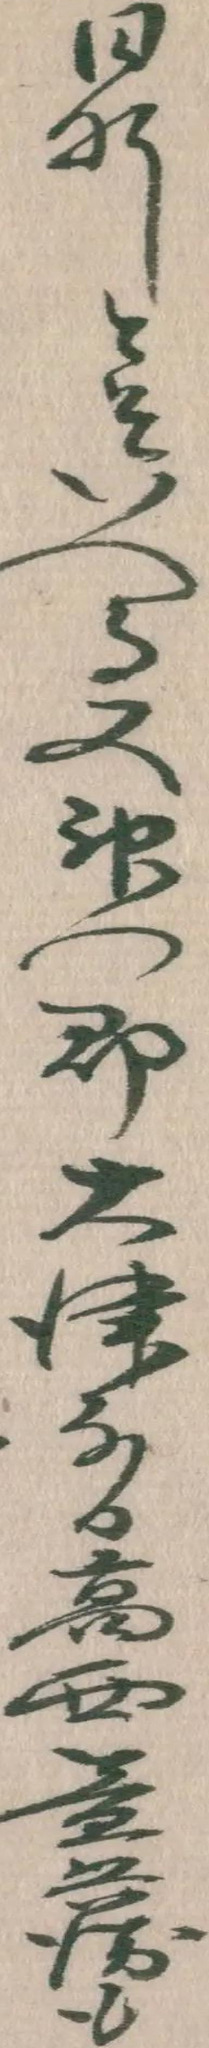日なしとそいへる又神門郡大津なる葛西益兵衛も
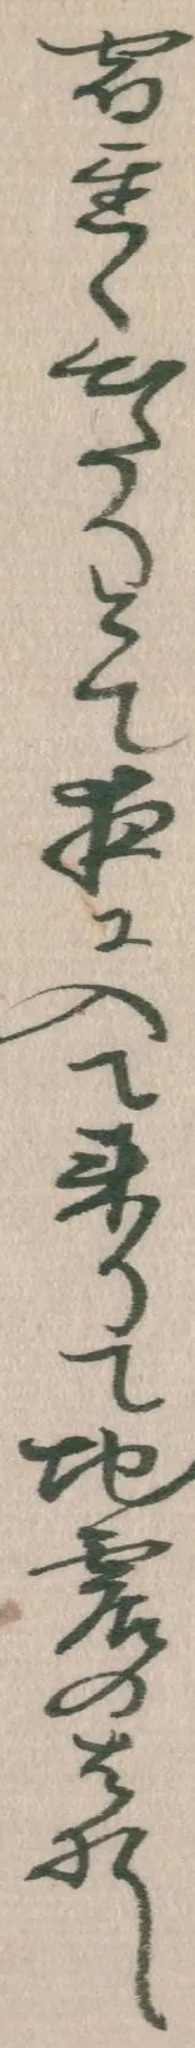宿遅出たりとて夜に入て来りて地震のはなし
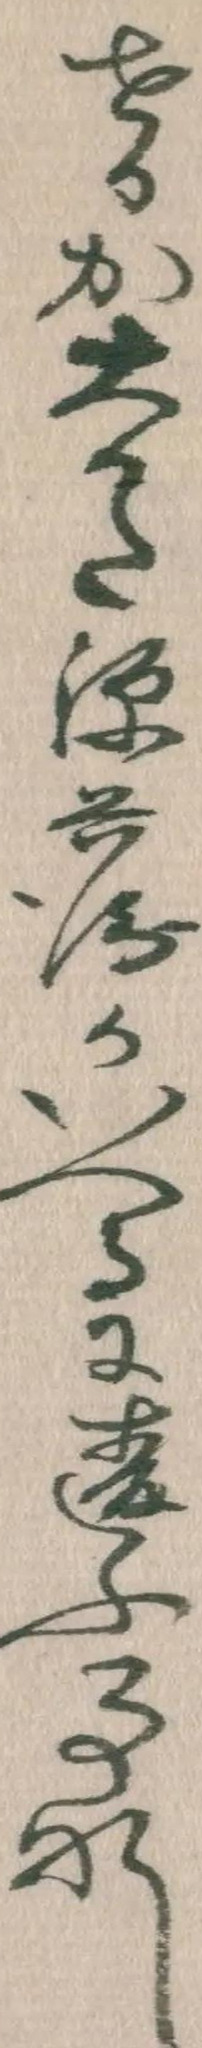せるか大かた源兵衛かいへるに違ふ事なし
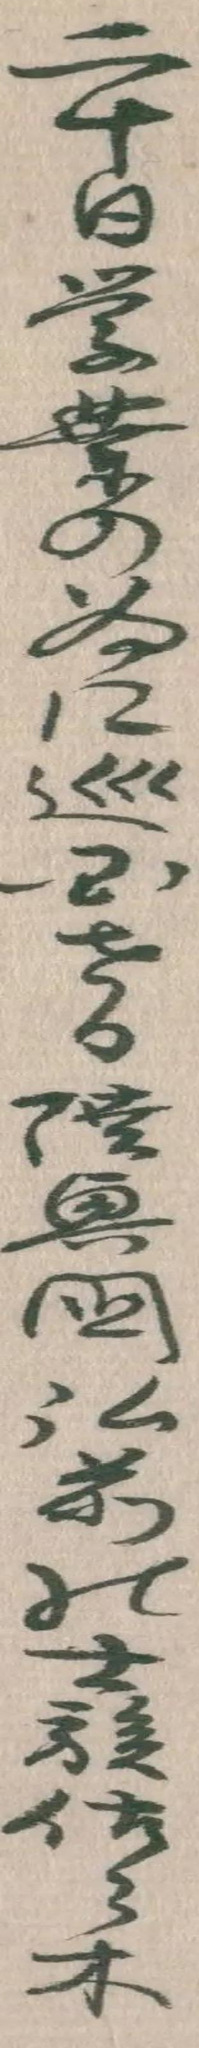二十日学業の為に巡国せる陸奥国弘前の士族佐々木
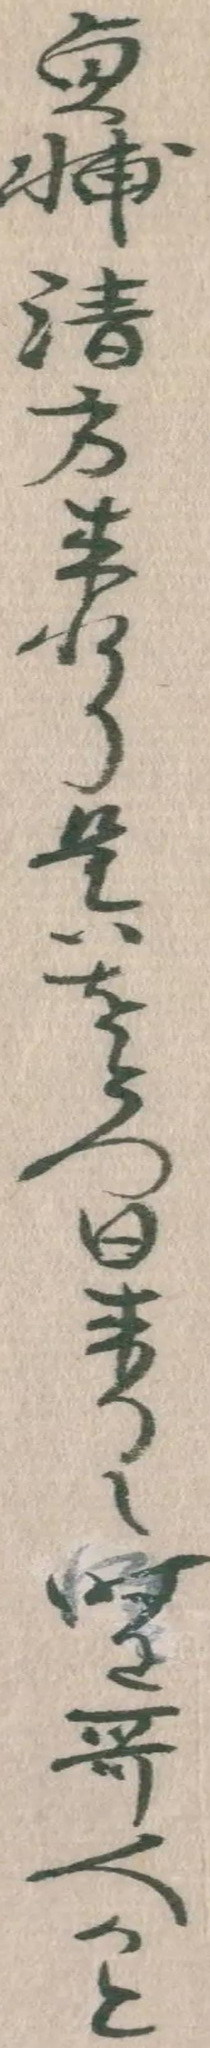貞輔清方来れり是はをとつ日来りし時に哥人かと
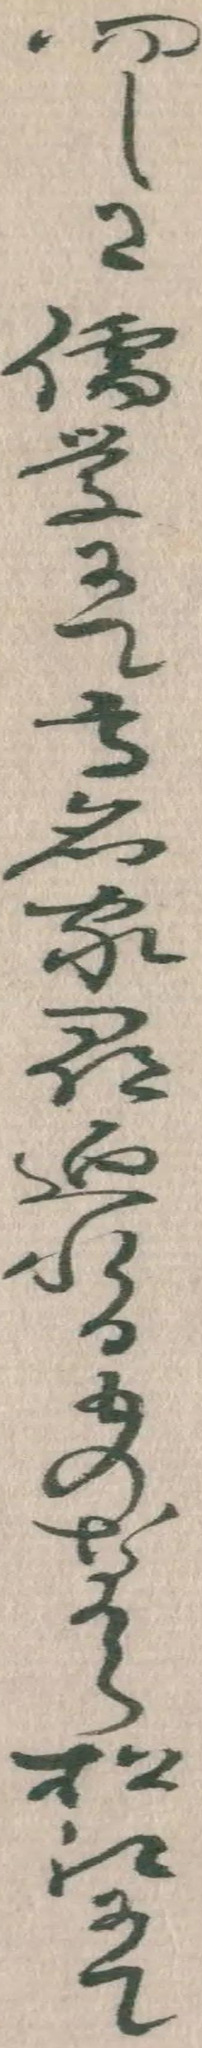問しに儒学にて高名家尋廻れるものなから松江にて
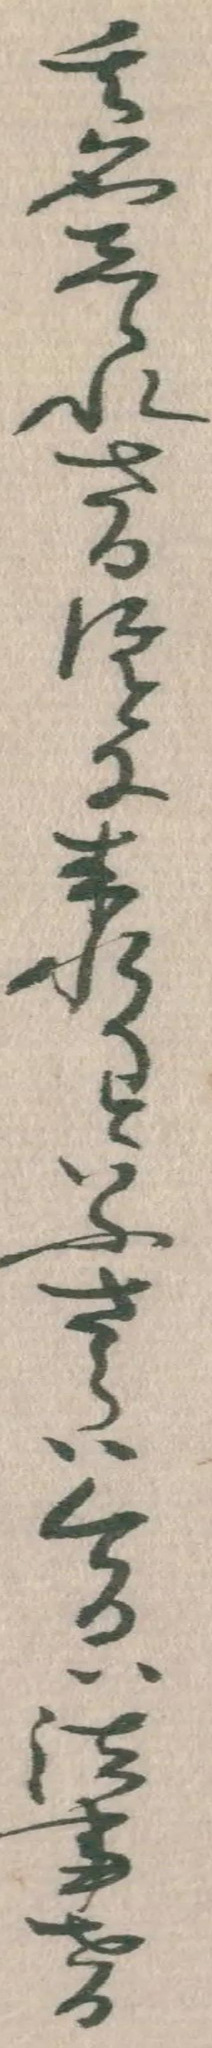其名しられさるほとに来れりといふさらは今日は法事せる
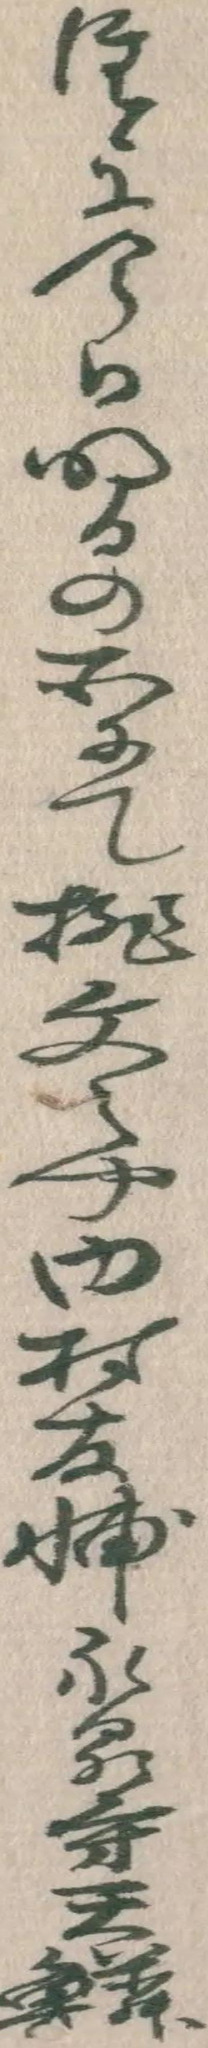ほとに今日明日の所にて挑文の師内村友輔永泉寺天鱗
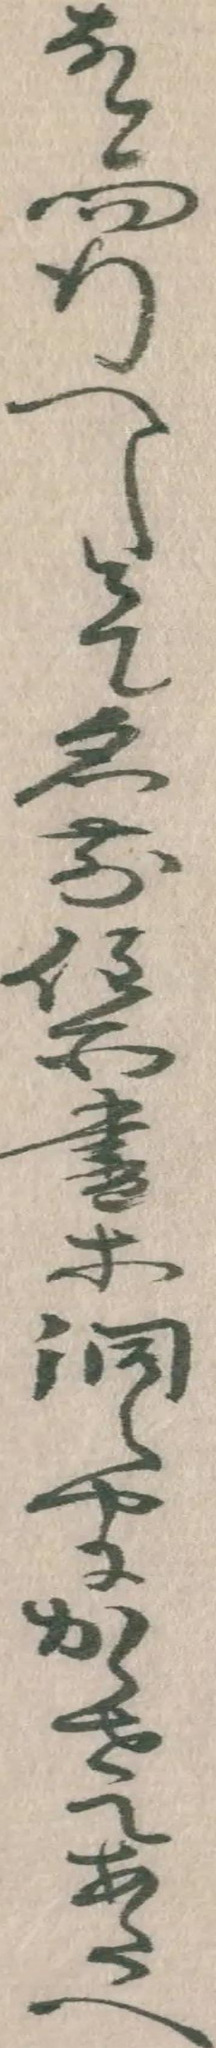なと問行へしとて名前住所書等調へ聞かゝせてあたへ
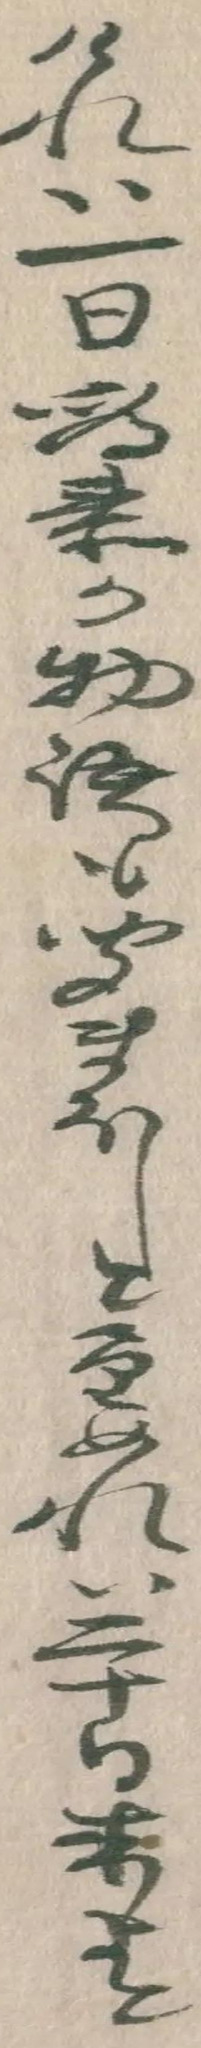けれは一日為泰か物語も聞まほしと望めれは二十日来よと

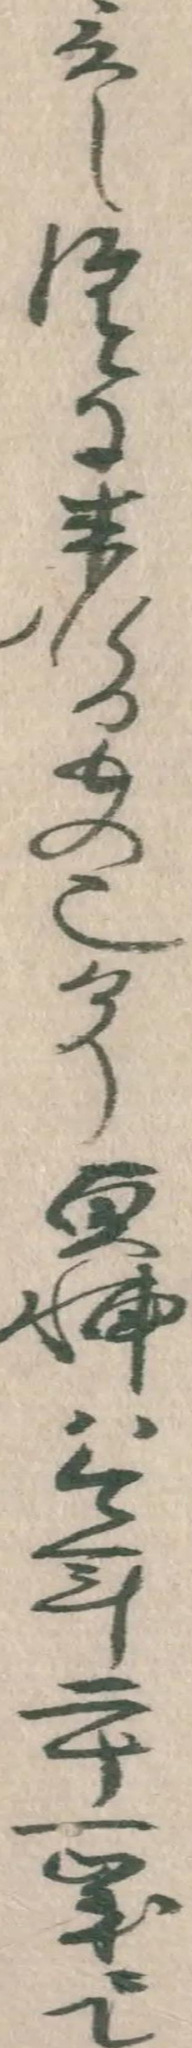言しほとに来れるもの也けり貞輔は今年二十一歳にて
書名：出雲紀行. 20
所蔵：国立国会図書館 National Diet Library, JAPAN
